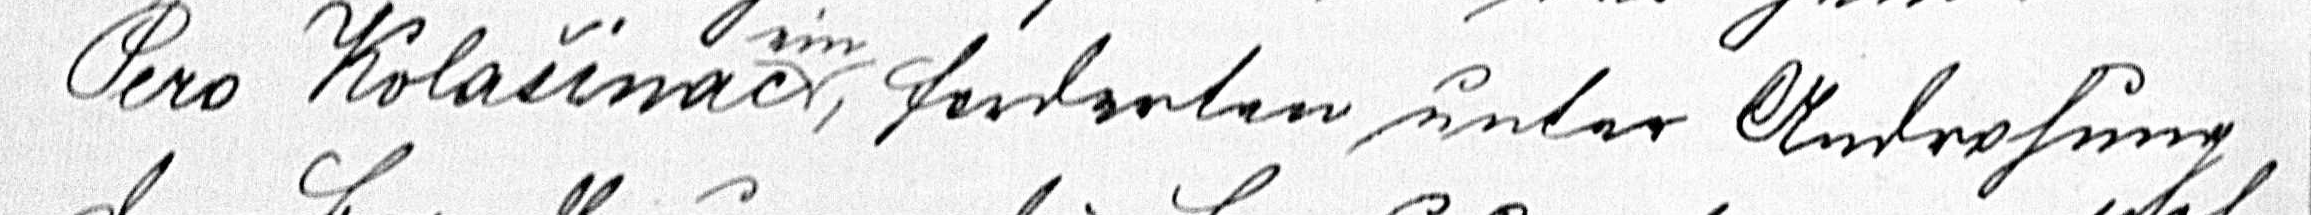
Pero Kolašinac, forderten unter Androhung
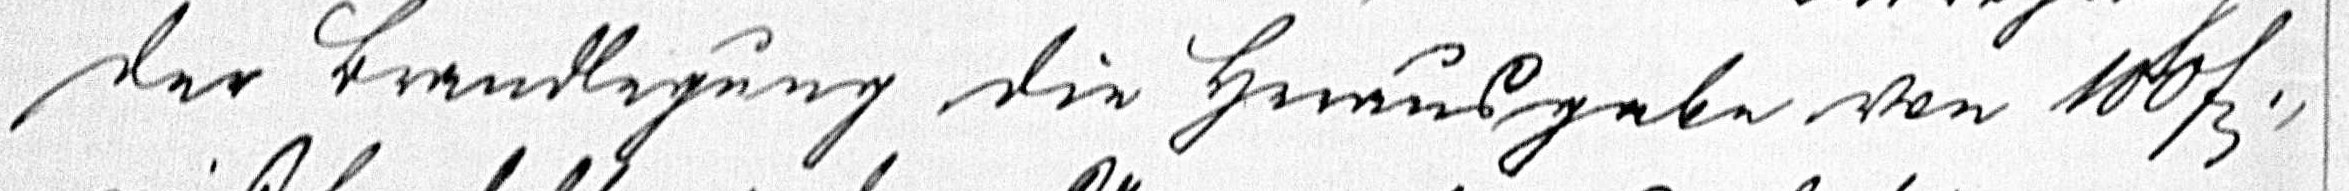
der Brandlegung die Herausgabe von 100 f.,
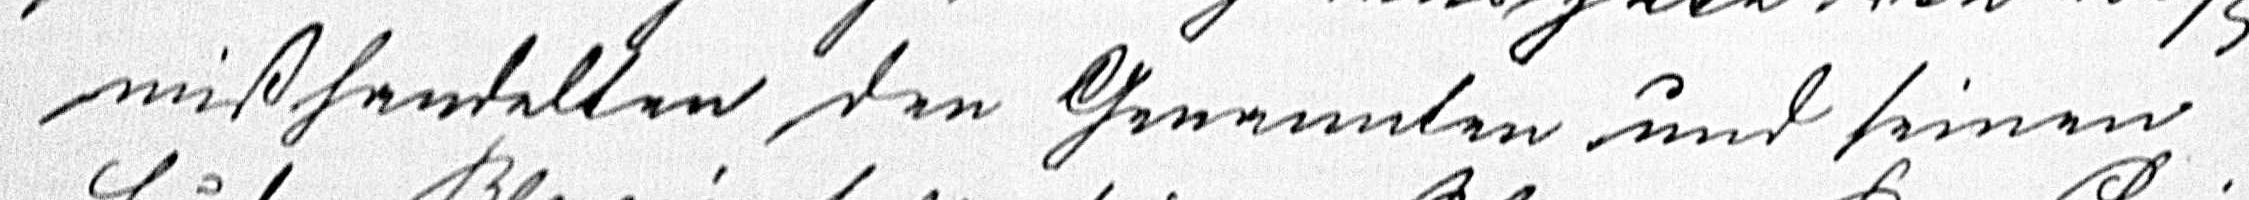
mißhandelten den Genannten und seinen
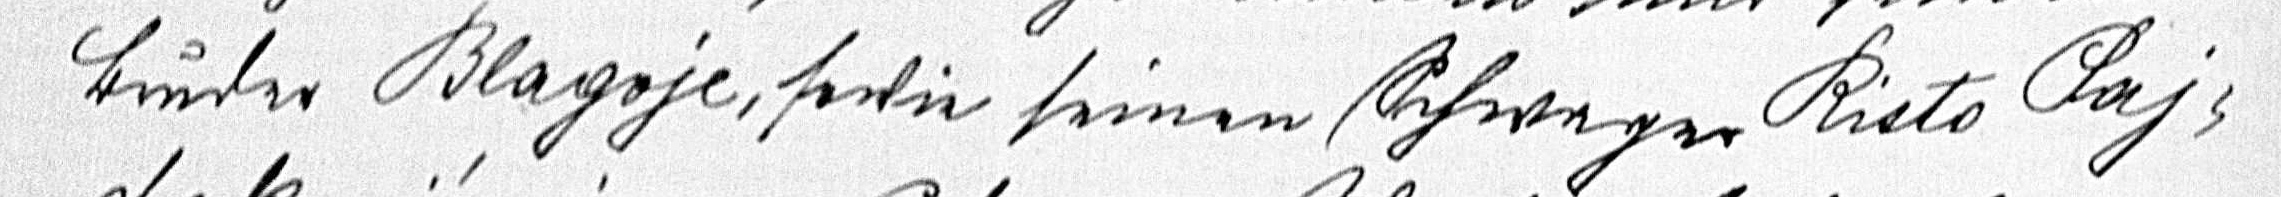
Bruder Blagoje, sowie seinen Schwager Risto Paj¬
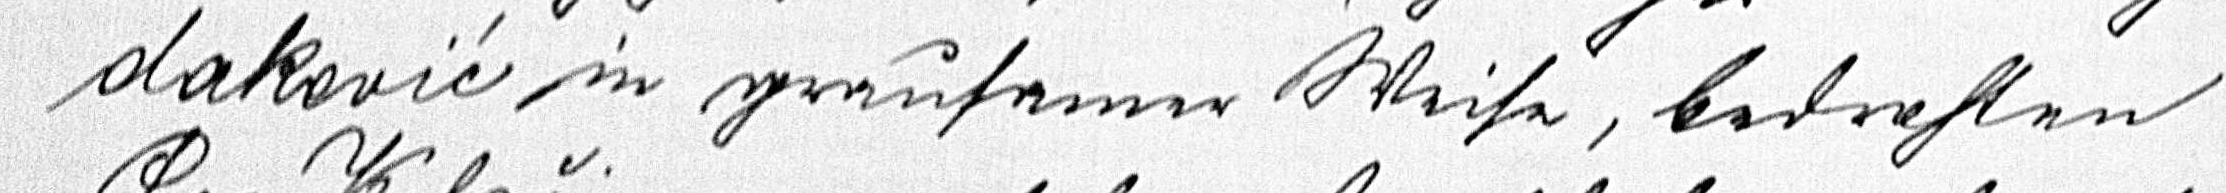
daković in grausamer Weise, bedrohten
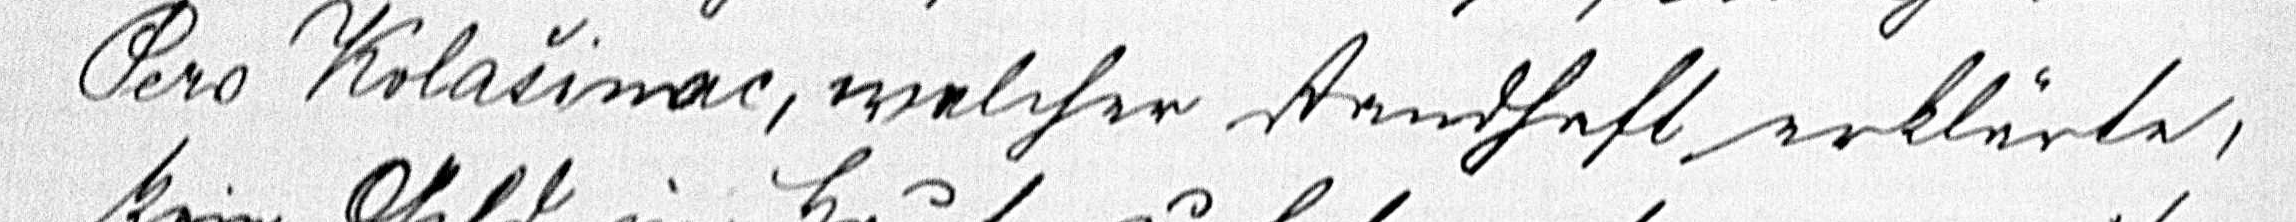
Pero Kolašinac, welcher standhaft erklärte,
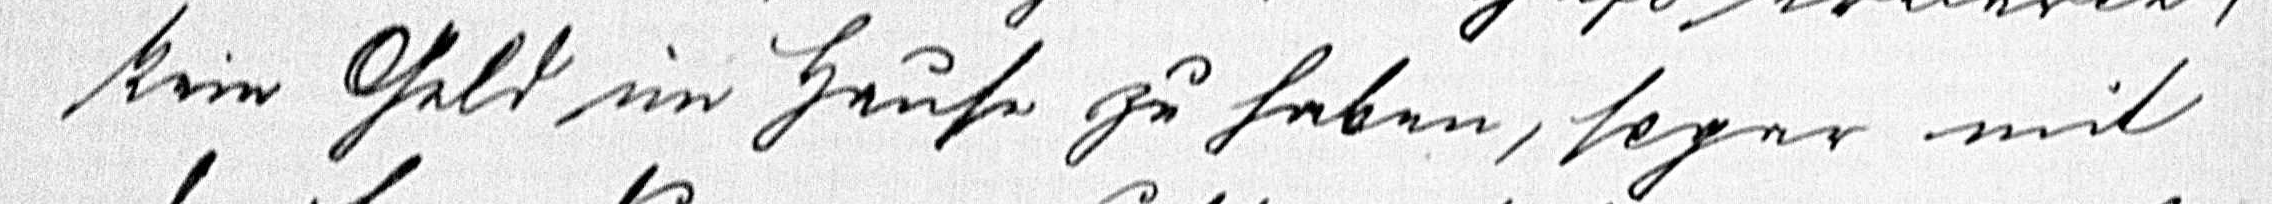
kein Geld im Hause zu haben, sogar mit
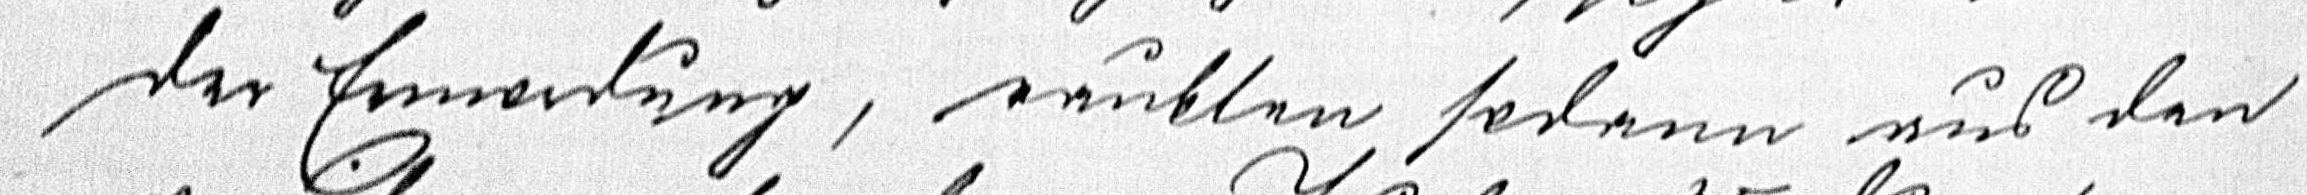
der Ermordung, raubten sodann aus den
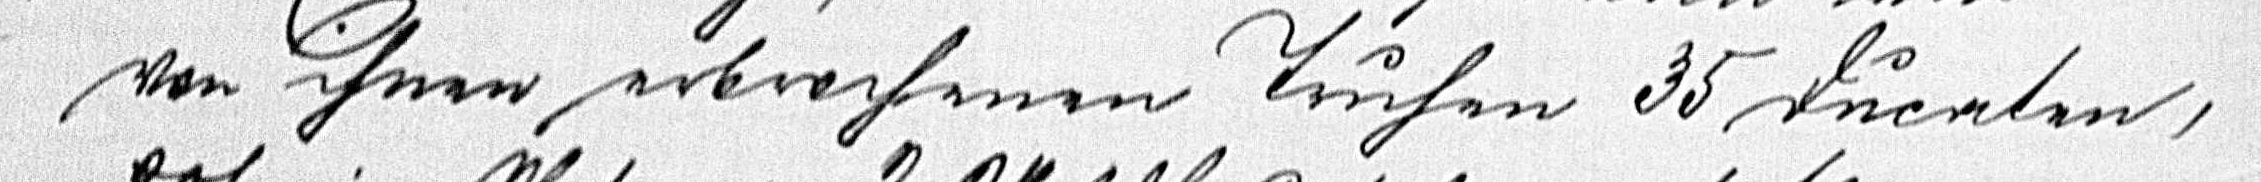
von ihnen erbrochenen Truhen 35 Ducaten,
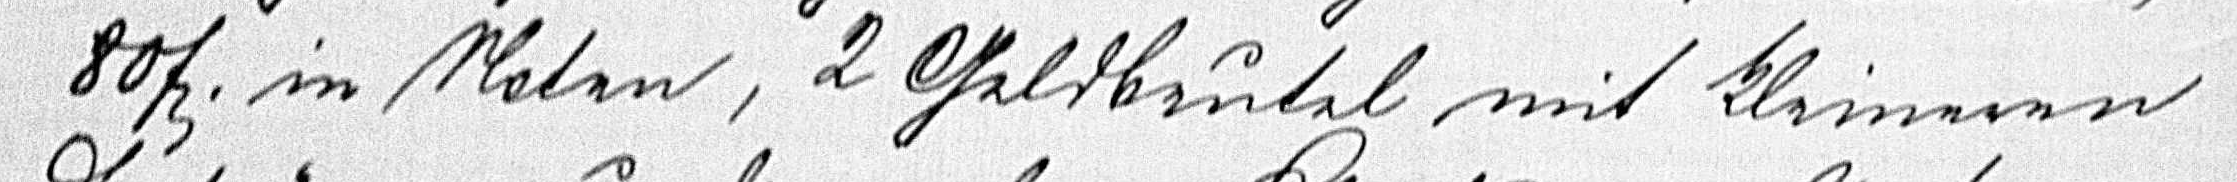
80f in Noten, 2 Geldbeutel mit kleineren
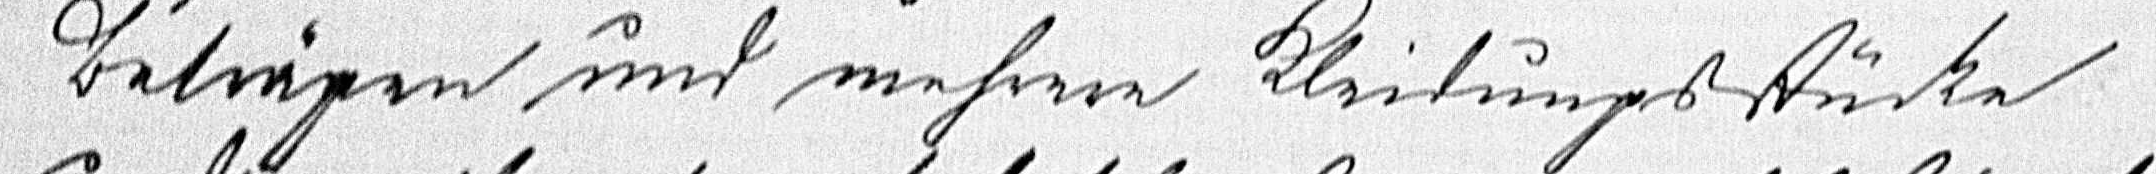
Beträgen und mehrere Kleidungsstücke
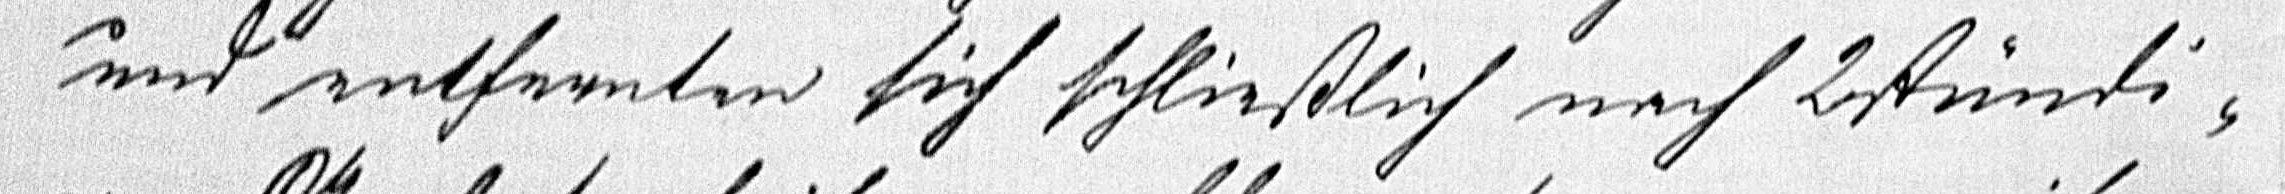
und entfernten sich schließlich nach 2stündi¬
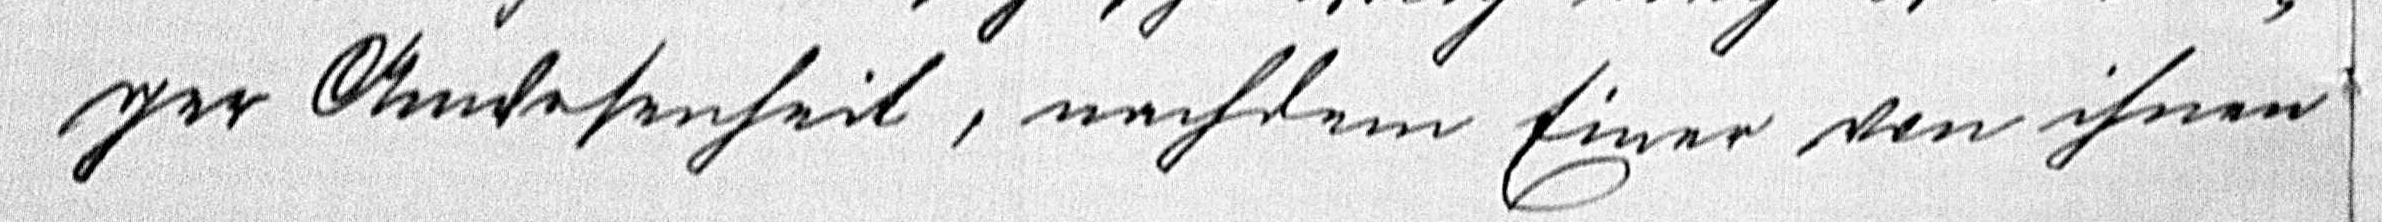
ger Anwesenheit, nachdem Einer von ihnen
